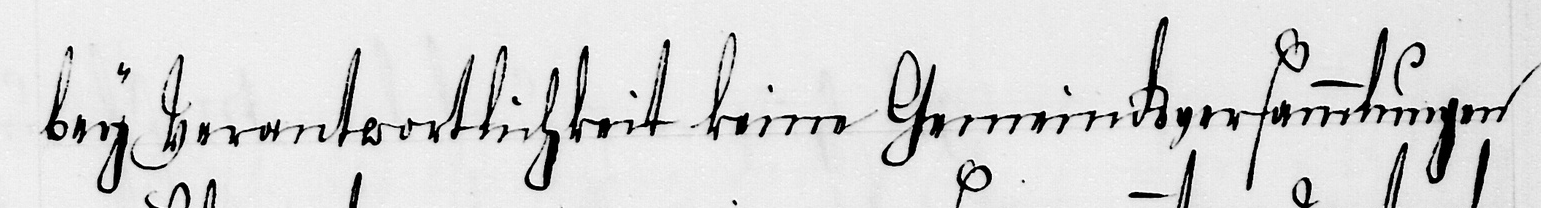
bey Verantwortlichkeit keine Gemeindsversammlungen
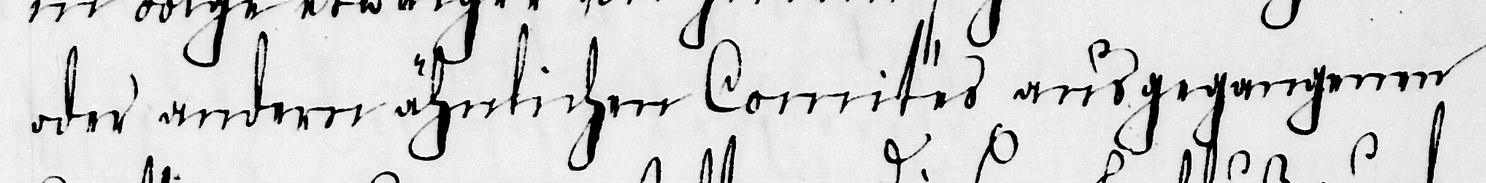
oder andern ähnlichen Comités ausgegangenen
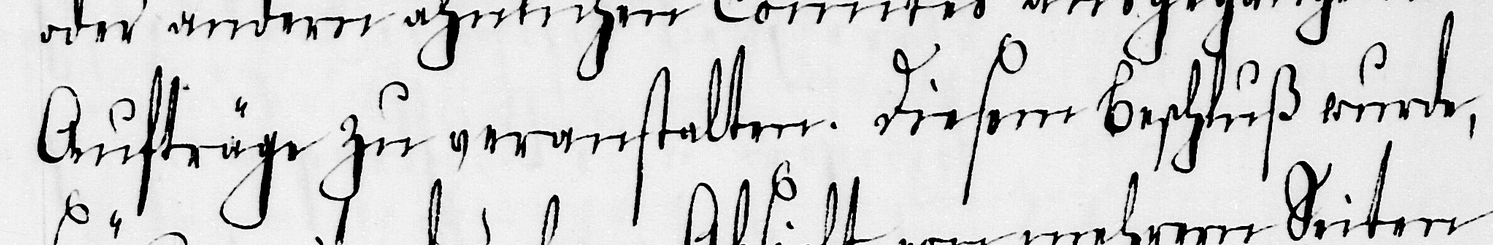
Aufträge zu veranstalten. Diesem Beschluß wurde,
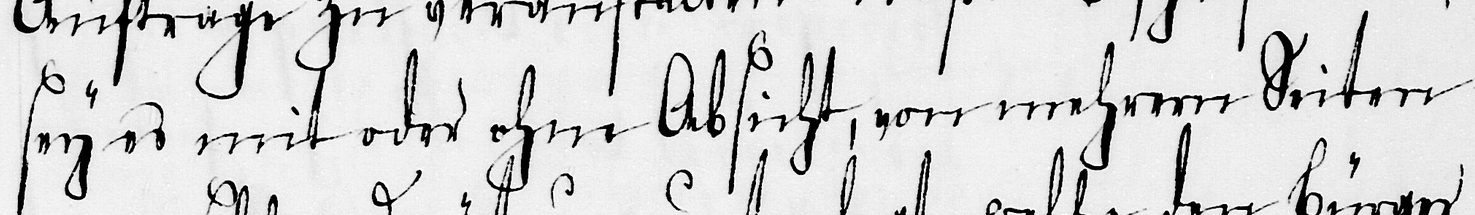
sey es mit oder ohne Absicht, von mehrern Seiten
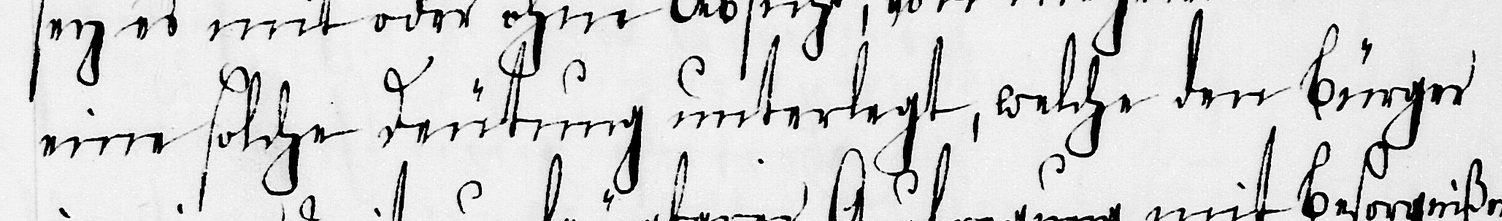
eine solche Deutung unterlegt, welche den Bürger
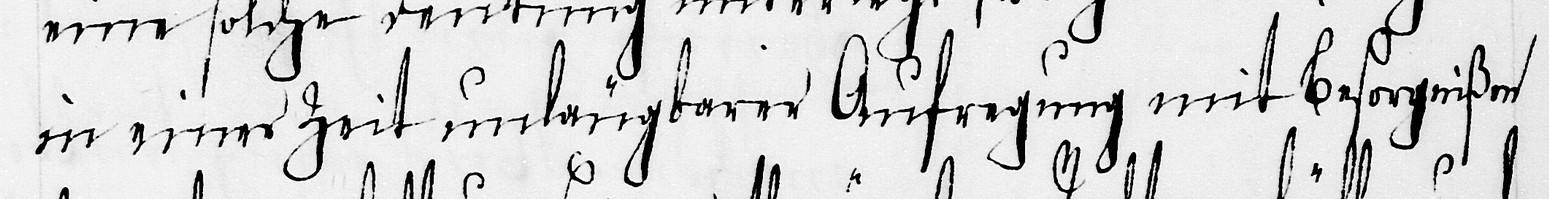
in einer Zeit unläugbarer Aufregung mit Besorgnißen
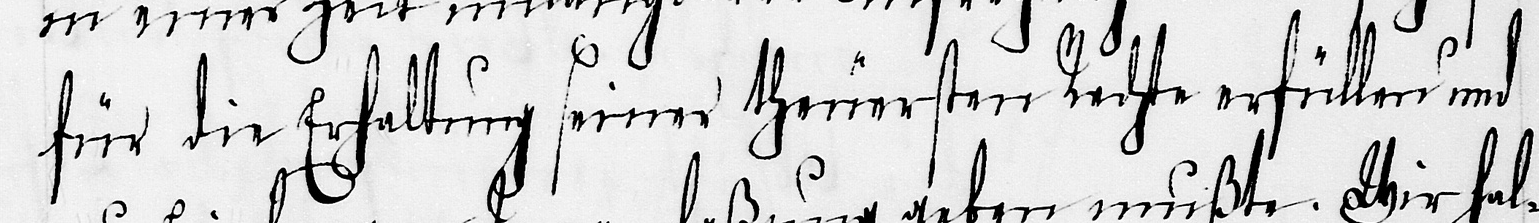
für die Erhaltung seiner theuersten Rechte erfüllen und
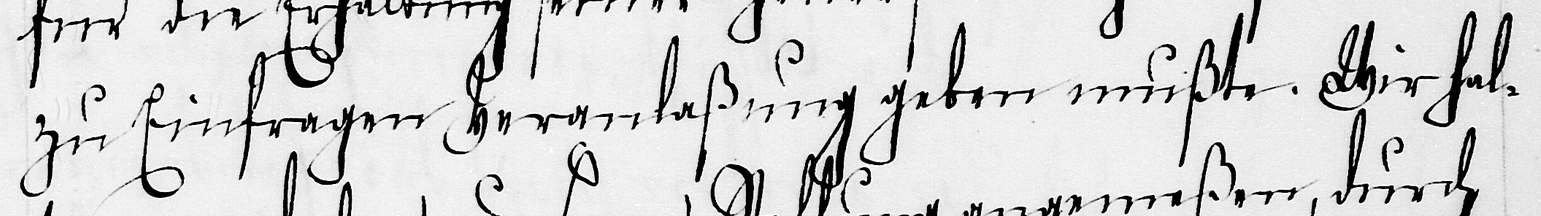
zu Einfragen Veranlaßung geben mußte. Wir hal¬
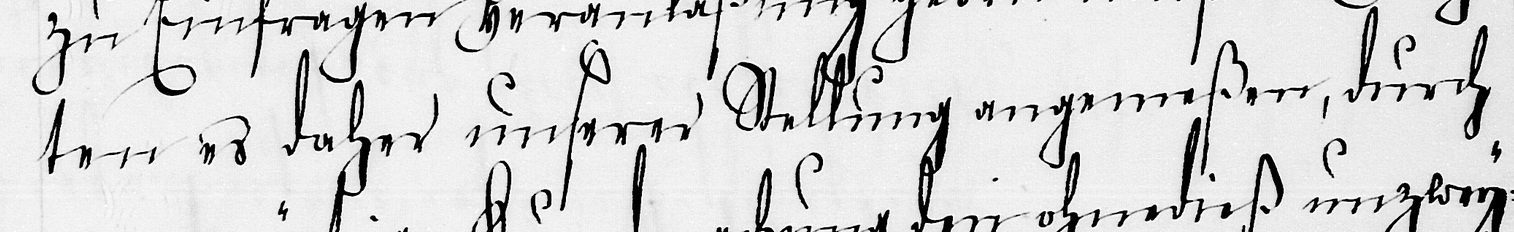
ten es daher unserer Stellung angemeßen, durch
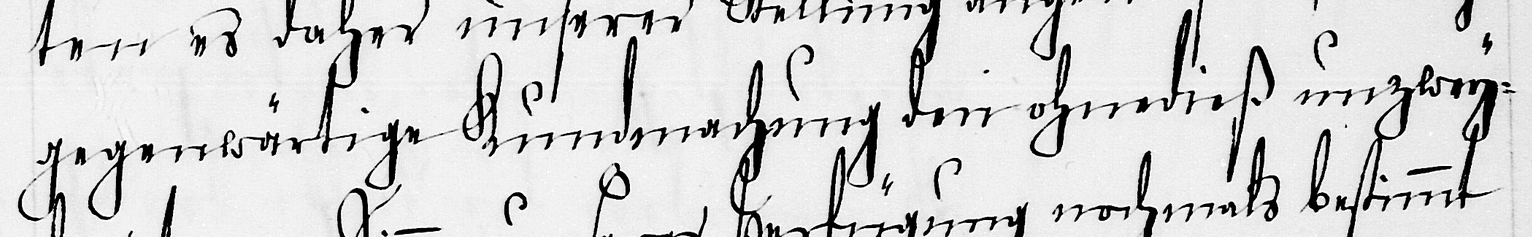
gegenwärtige Kundmachung den ohnedieß unzwey¬
